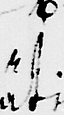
f¬
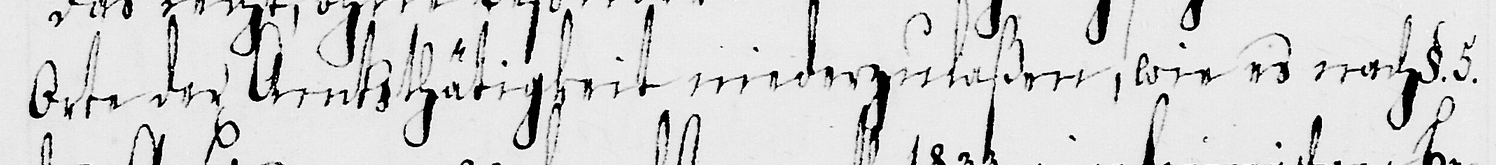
Orte der Amtsthätigkeit niederzulaßen, wie es nach §. 5.
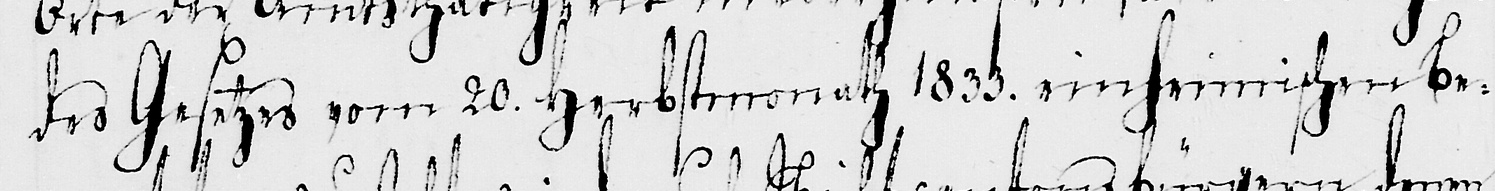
des Gesetzes vom 20. Herbstmonath 1833. einheimischen Be¬
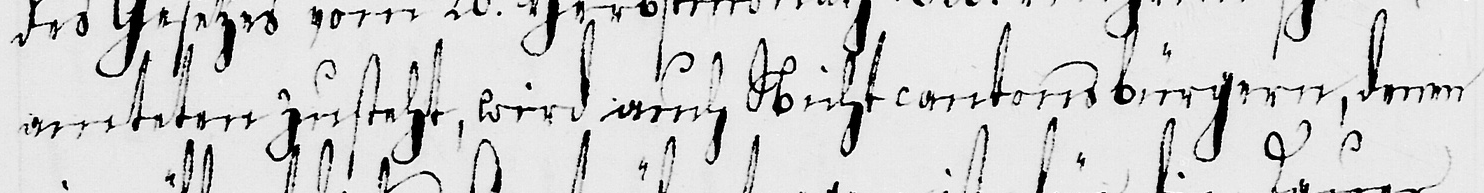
amteten zusteht, wird auch Nichtcantonsbürgern, denen
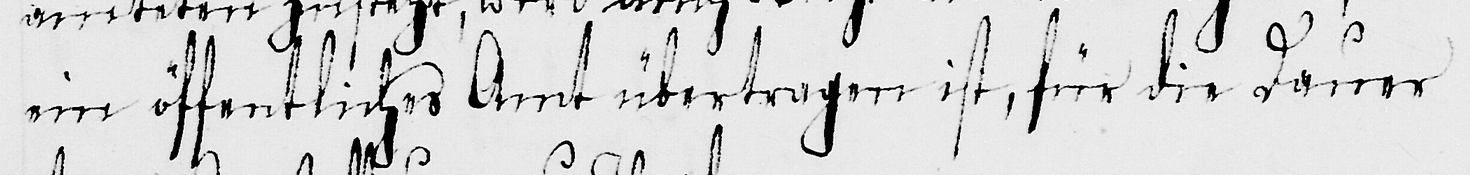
ein öffentliches Amt übertragen ist, für die Dauer
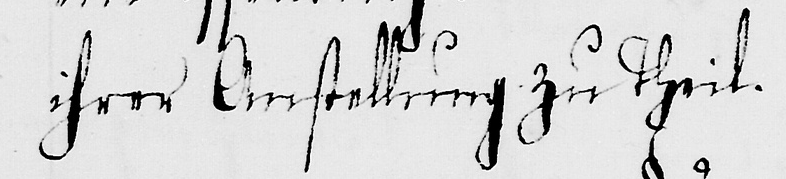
ihrer Anstellung zu Theil.
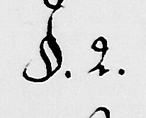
§. 2.
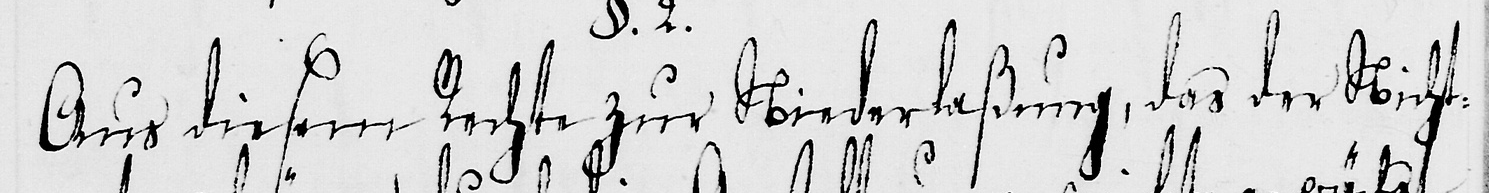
Aus diesem Rechte zur Niederlaßung, das der Nicht¬
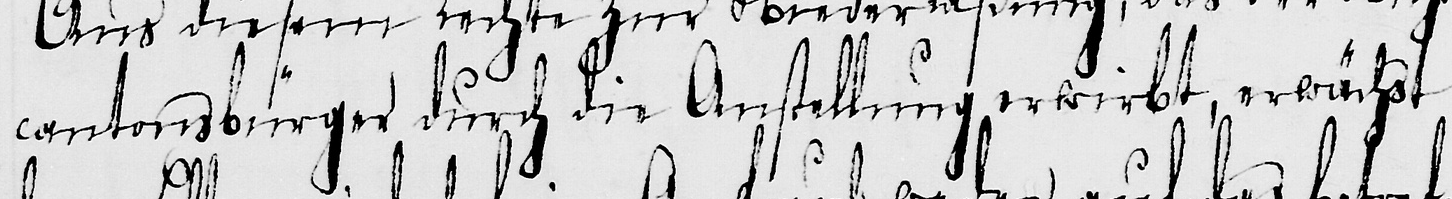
cantonsbürger durch die Anstellung erwirbt, erwächst
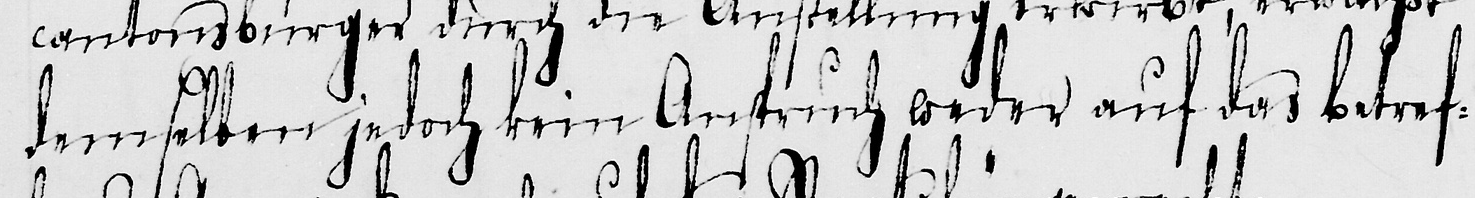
demselben jedoch kein Anspruch weder auf das betre¬
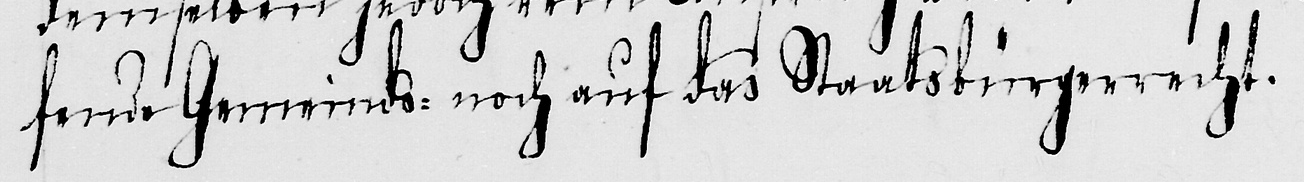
fende Gemeinds- noch auf das Staatsbürgerrecht.
